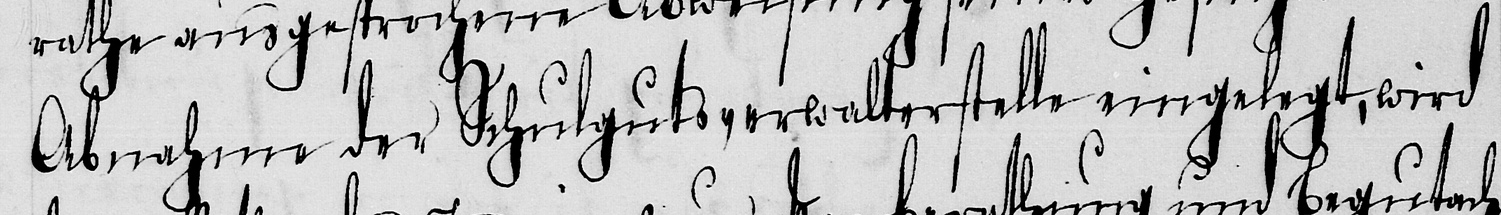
Abnahme der Schulgutsverwalterstelle eingelegt, wird
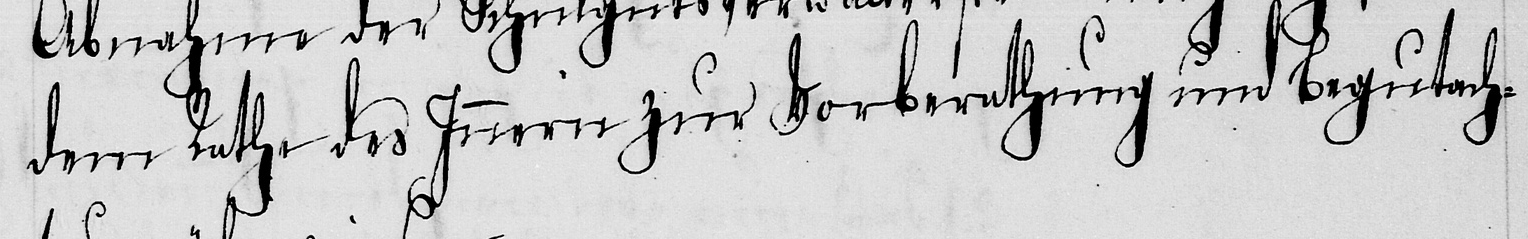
dem Rathe des Innern zur Vorberathung und Begutach¬
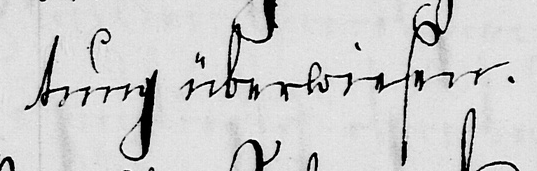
tung überwiesen.
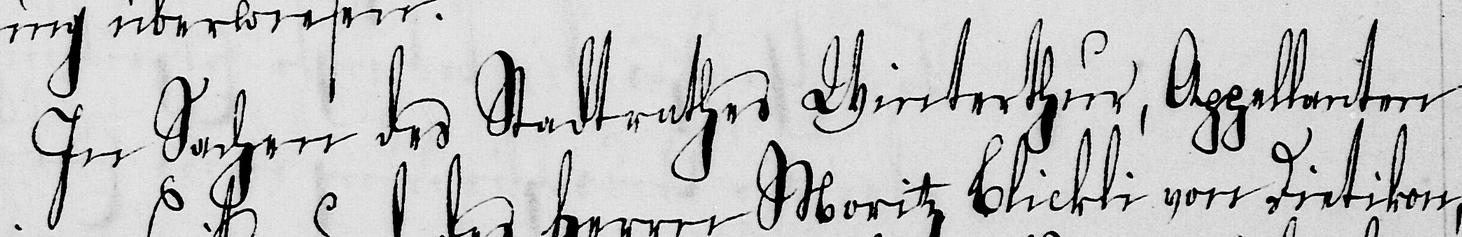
In Sachen des Stadtrathes Winterthur, Appellanten
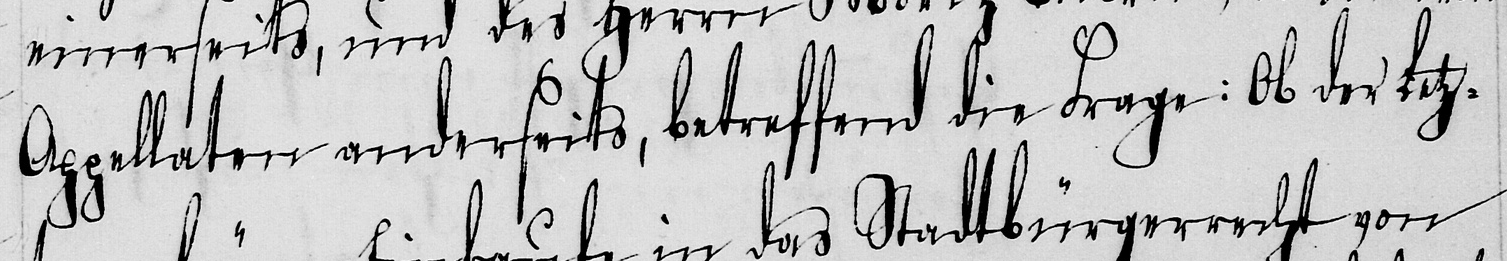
ppellaten anderseits, betreffend die Frage:
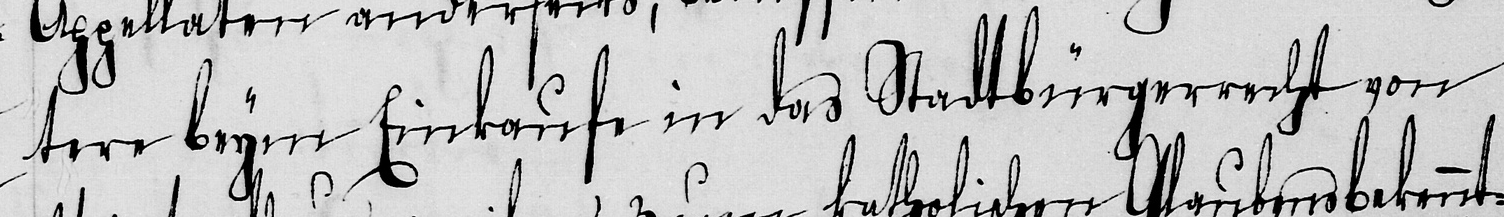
tere beym Einkaufe in das Stadtbürgerrecht von
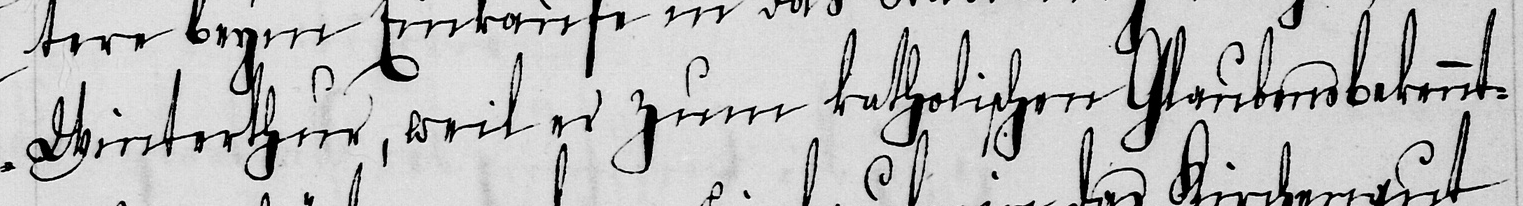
Winterthur, weil er zum katholischen Glaubensbekenn¬
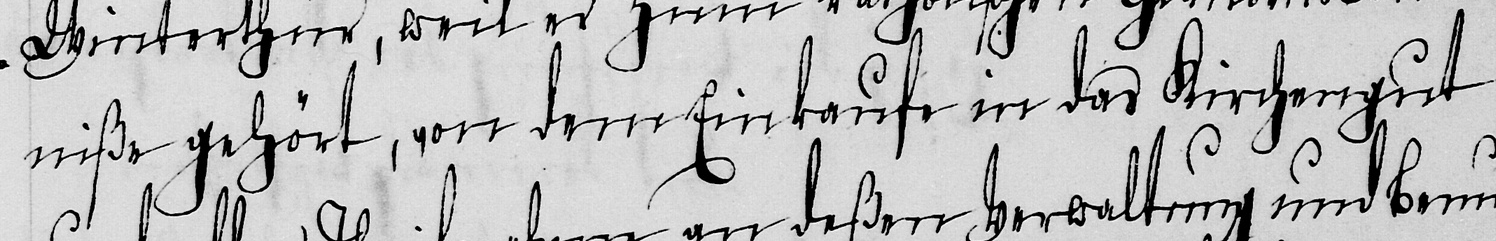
tnis gehört, von dem Einkaufe in das Kirchengut
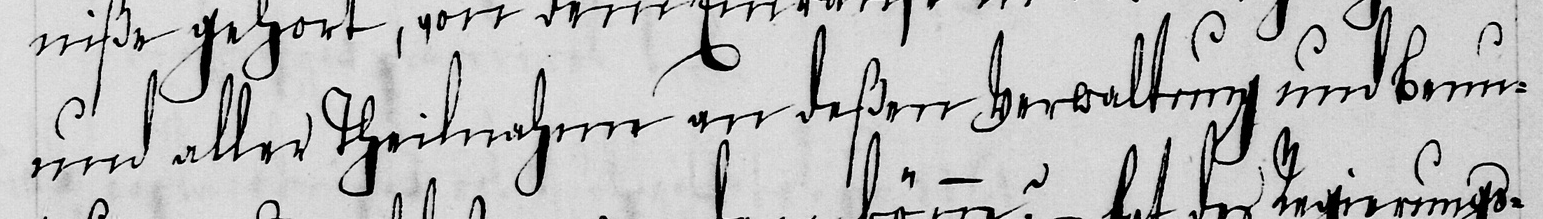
und aller Theilnahme an deßen Verwaltung und Benu¬
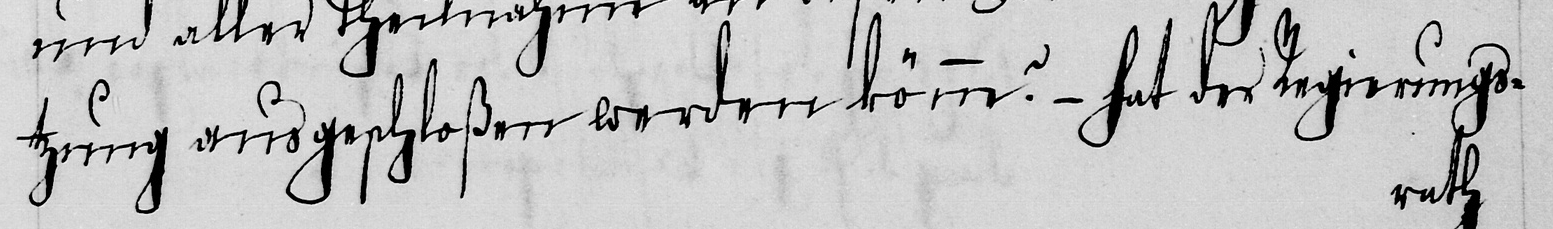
tzung ausgeschloßen werden könne? – hat der Regierungs-
